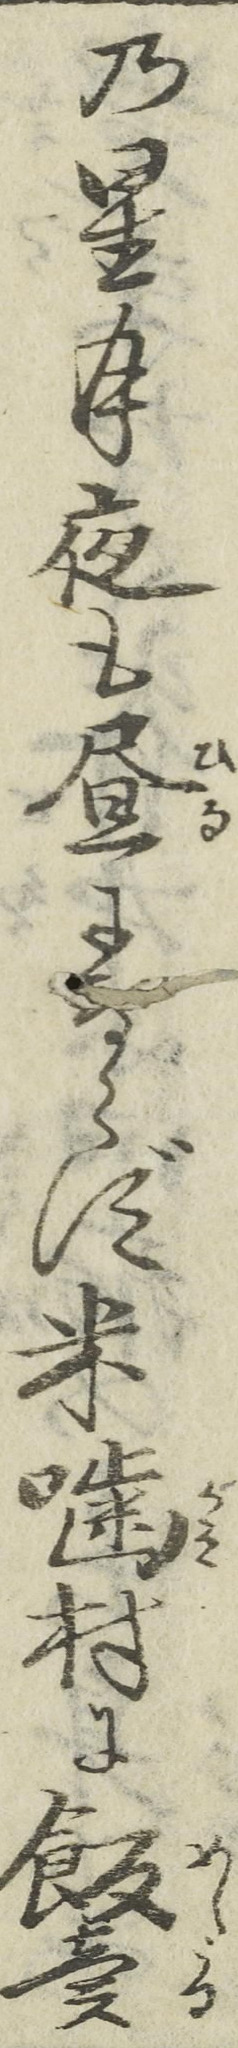の星月夜も昼にならず米噛村に飯売
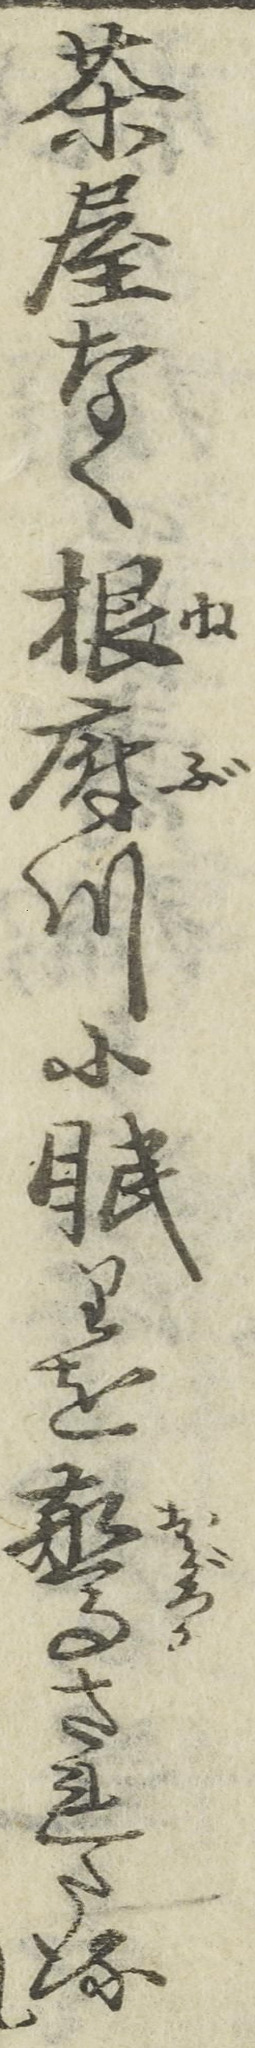茶屋なく根府川に眠りを驚されたるも
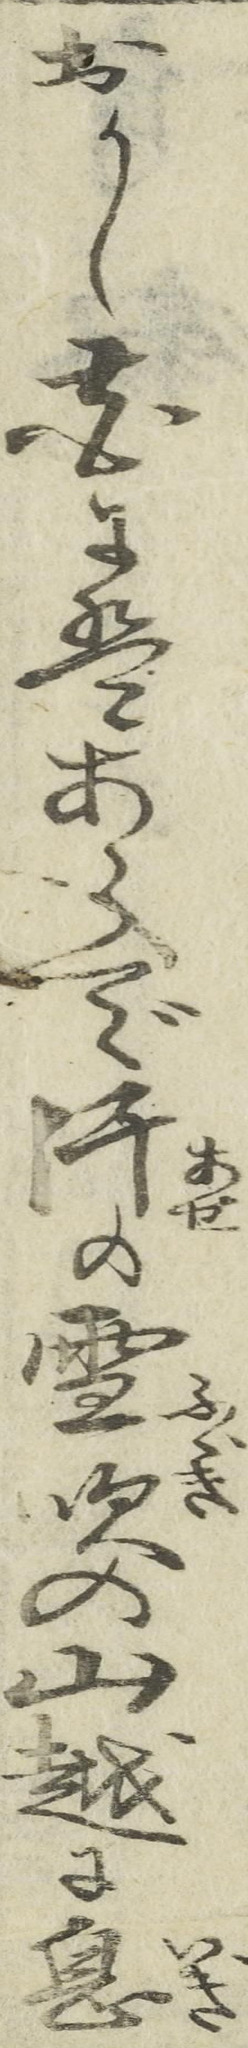おかし花にはあらで汗の雪吹の山越に息
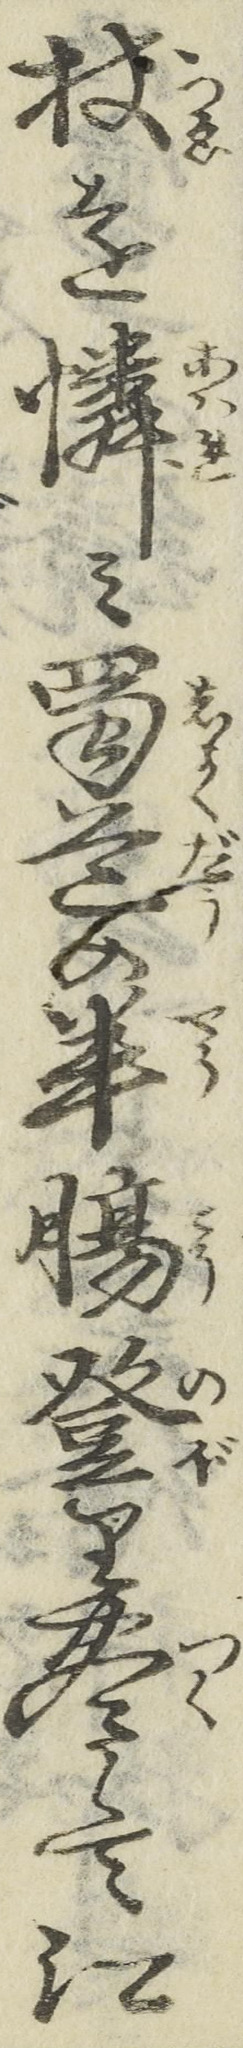杖を憐み蜀道の羊腸登り尽して江
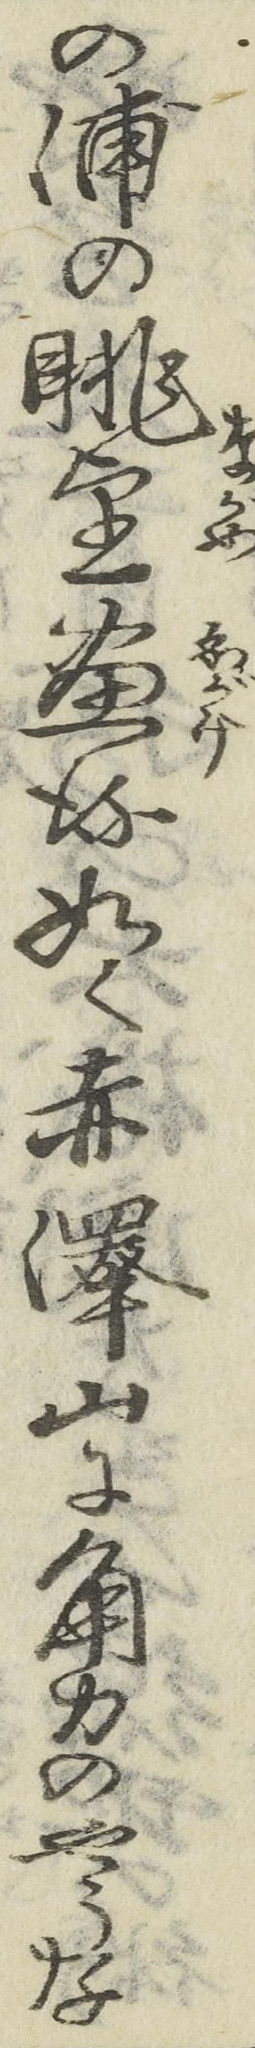の浦の眺望画る如く赤澤山に角力のやうな
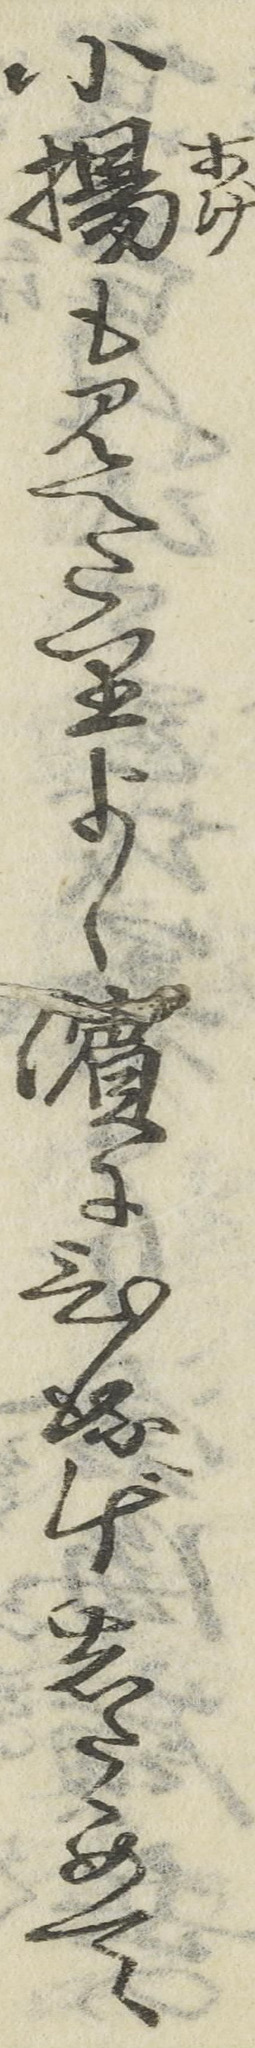小揚も見へたりよし濱にひるげしたゝめて
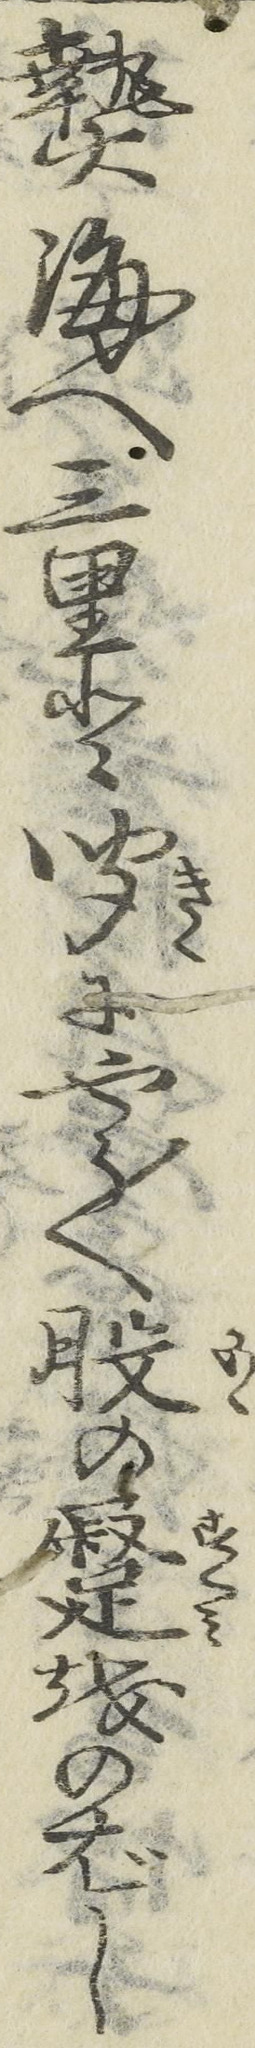熱海へ三里と聞にやう〳〵股の蹙をのばし
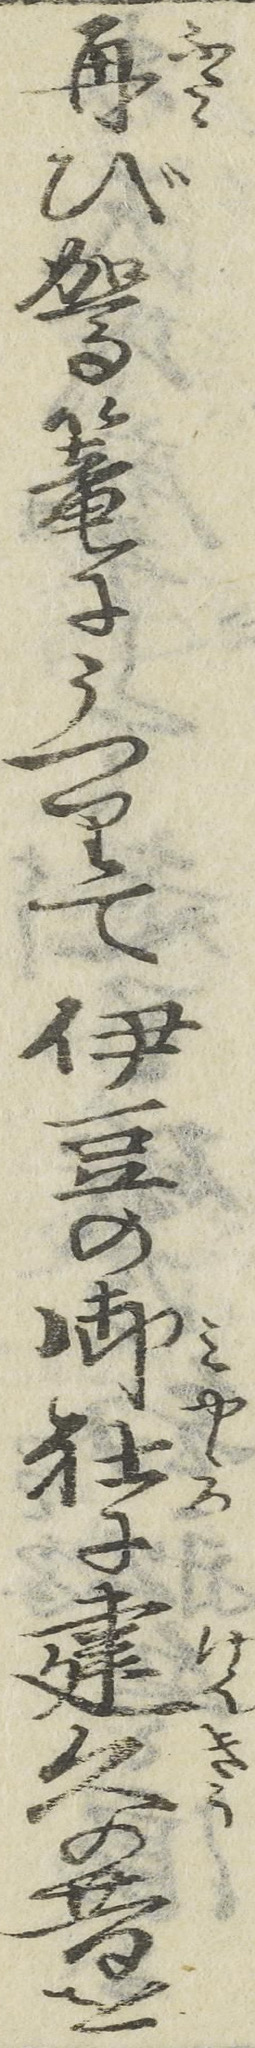再び駕籠にうつりて伊豆の御社に建久の昔を
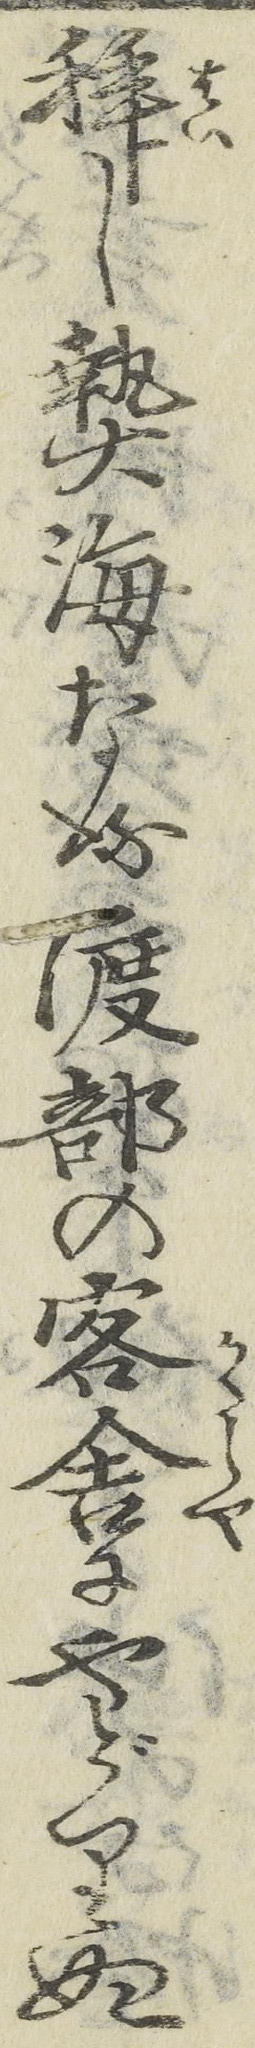拝し熱海なる渡部の客舎にやどりぬ
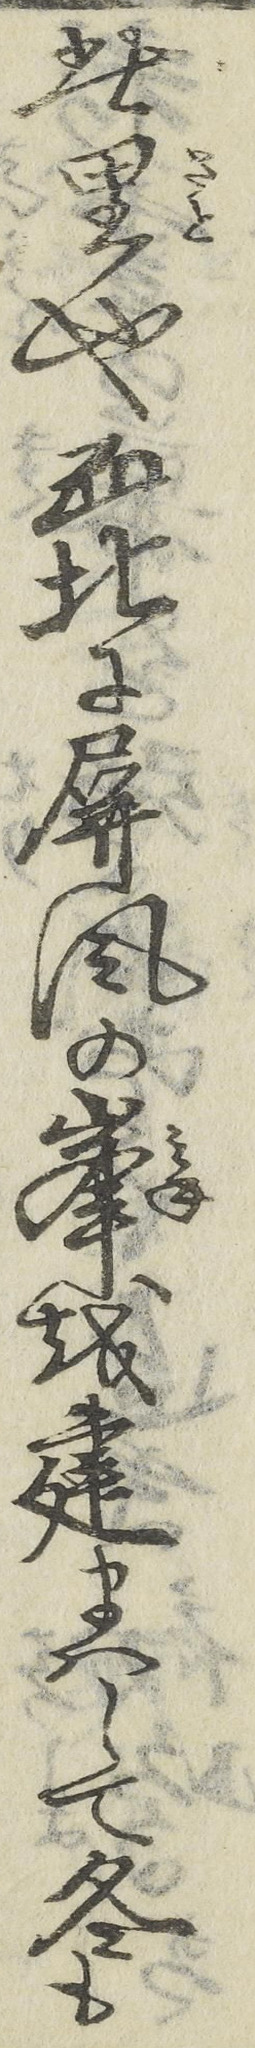此里や西北に屏風の峰を建まはして冬も
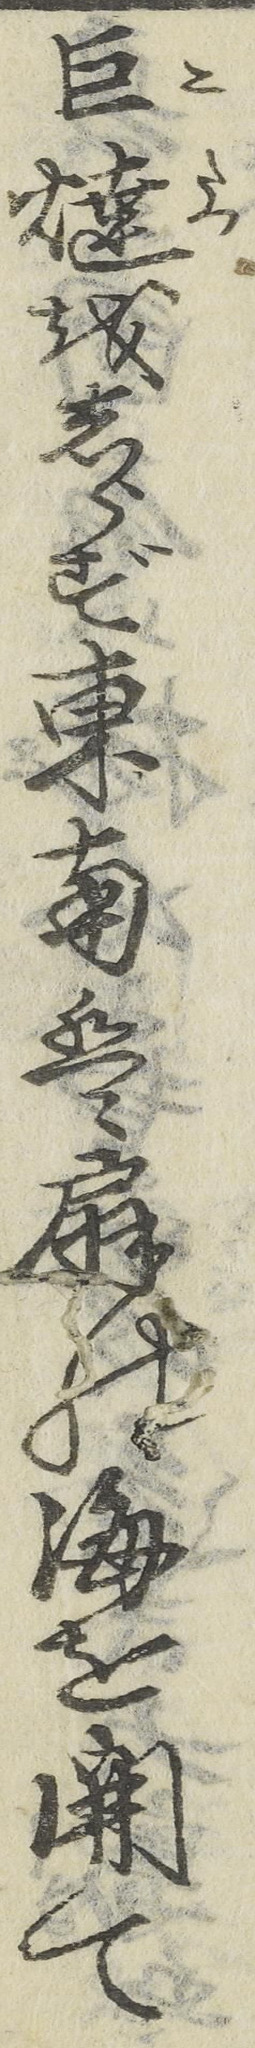巨燵をしらず東南は扇の海を開て

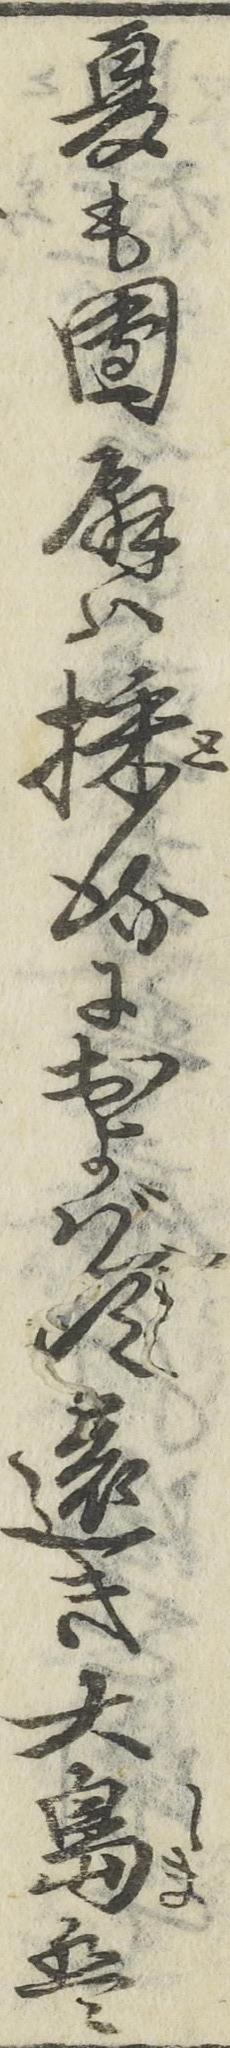夏も団扇は採るにおよばず遠き大島は
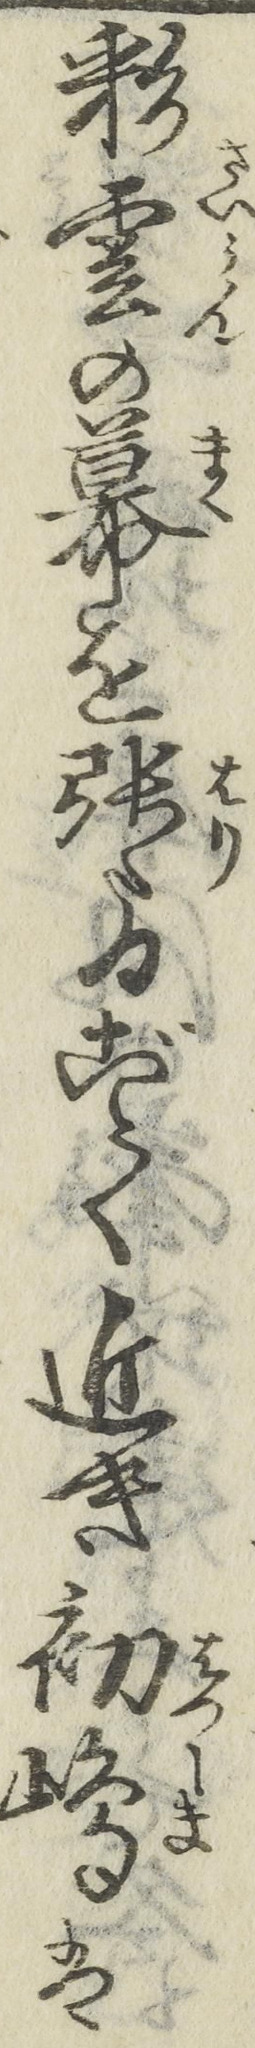彩雲の幕を張たるごとく近き初嶋は
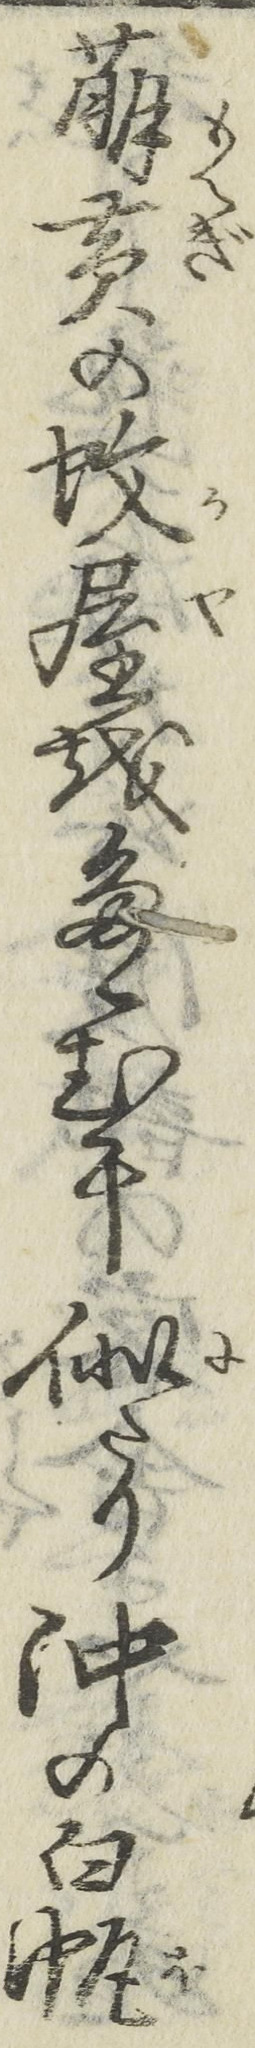萌黄の蚊屋をたゝむに似たり沖の白帆
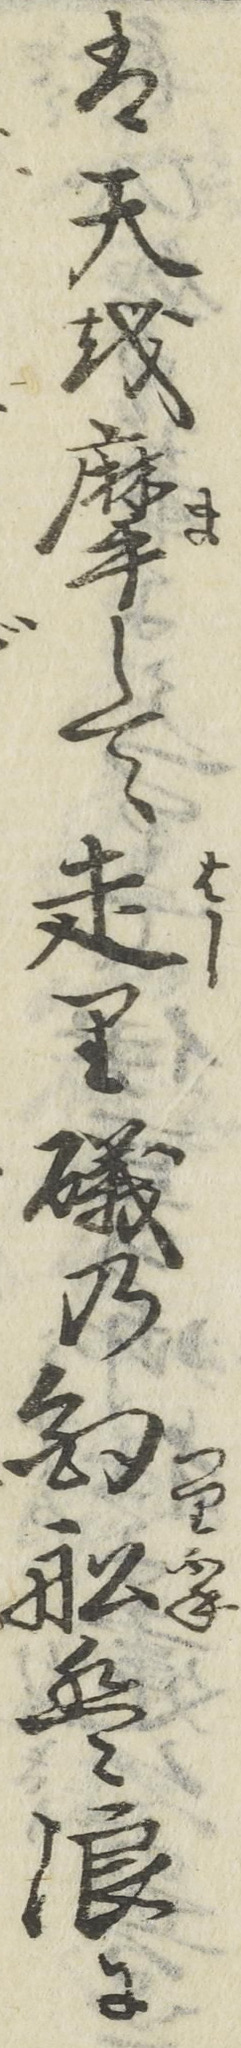は天を摩して走ろ磯の釣船は浪に
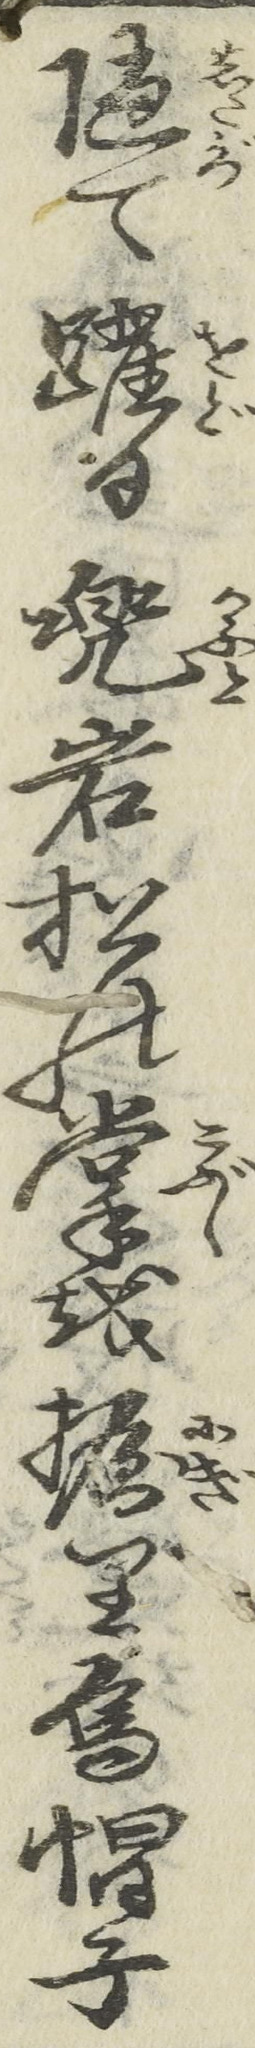随て躍る兜岩松の掌を握り烏帽子
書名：熱海温泉圖彙
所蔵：東京大学地震研究所図書室 Earthquake Research Institute Library, The University of Tokyo, JAPAN
